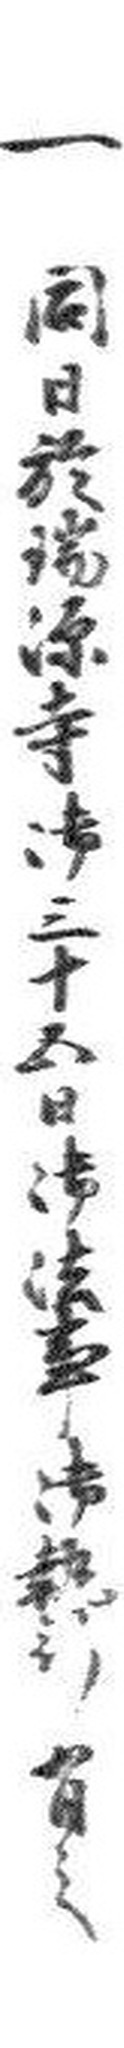一同日於瑞源寺御三十五日御法事御執行有之
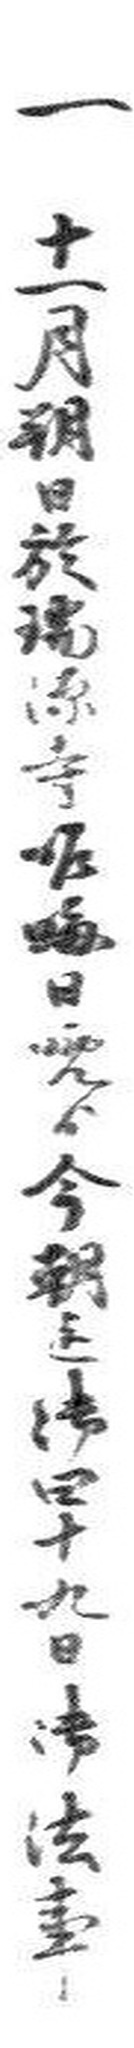一十一月朔日於瑞源寺昨晦日晩ゟ今朝迄御四十九日御法事
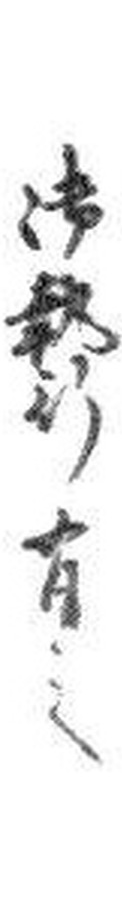御執行有之
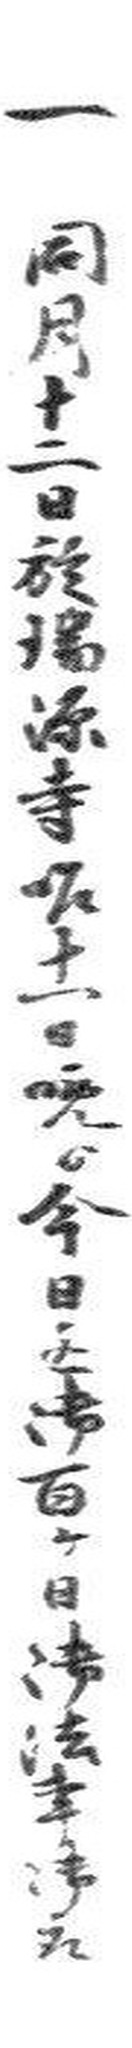一同月十二日於瑞源寺昨十一日晩ゟ今日迄御百ヶ日御法事御取
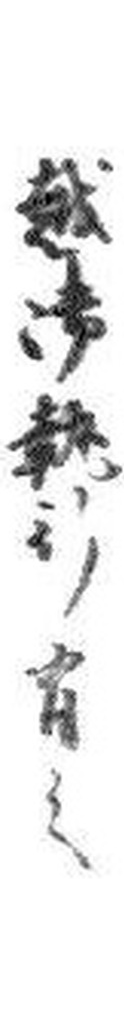越御執行有之

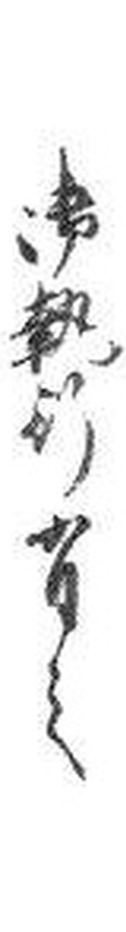御執行有之
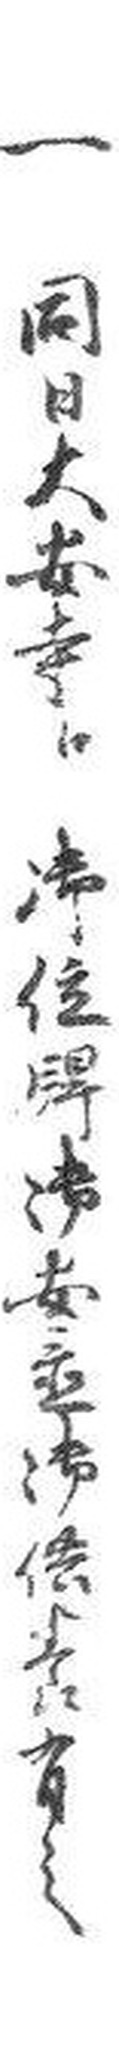一同日大安寺江御位牌御安置御供養有之
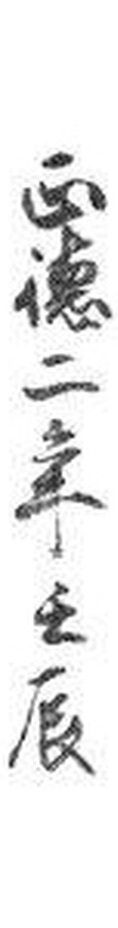正徳二年壬辰
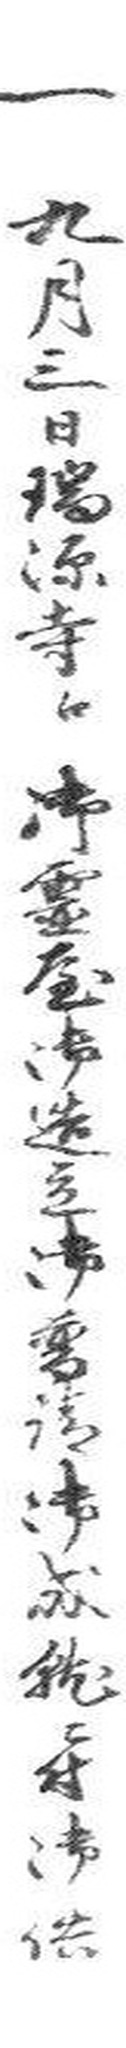一九月三日瑞源寺江御霊屋御造立御普請御成就ニ付御供
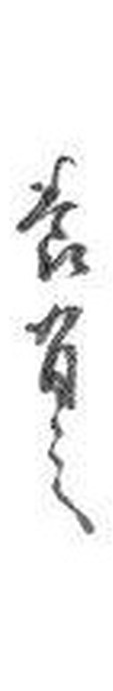養有之
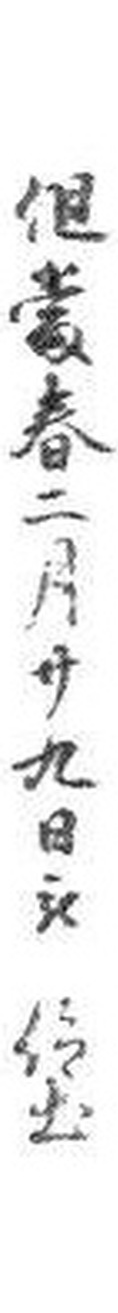但当春二月廿九日被仰出
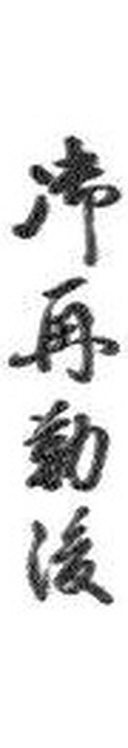御再勤後
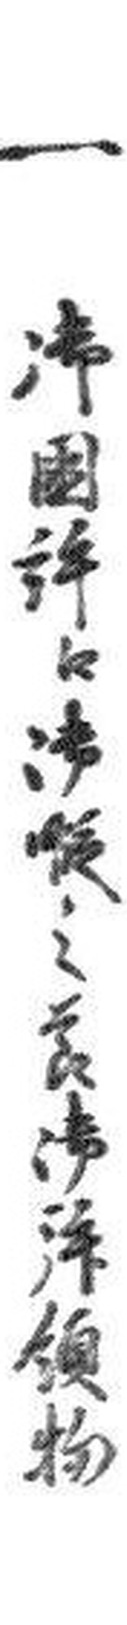一御国許江御暇之節御拝領物
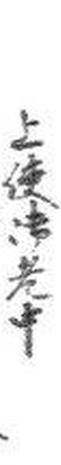上使御老中
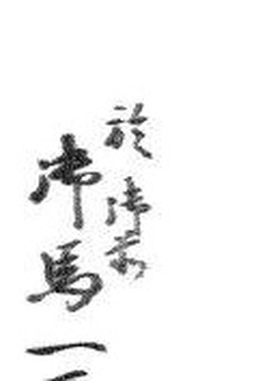於御前
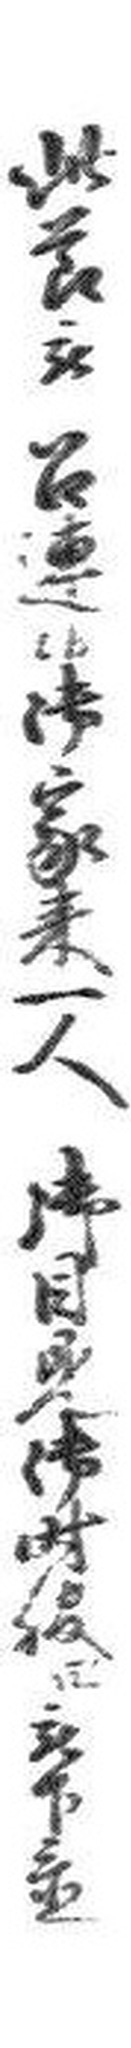此節被召連候御家来一人御目見御時服四被下置
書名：家譜 二十六 吉品公 従宝永七年到正徳二年
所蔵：福井県文書館 Fukui Prefectural Archives
